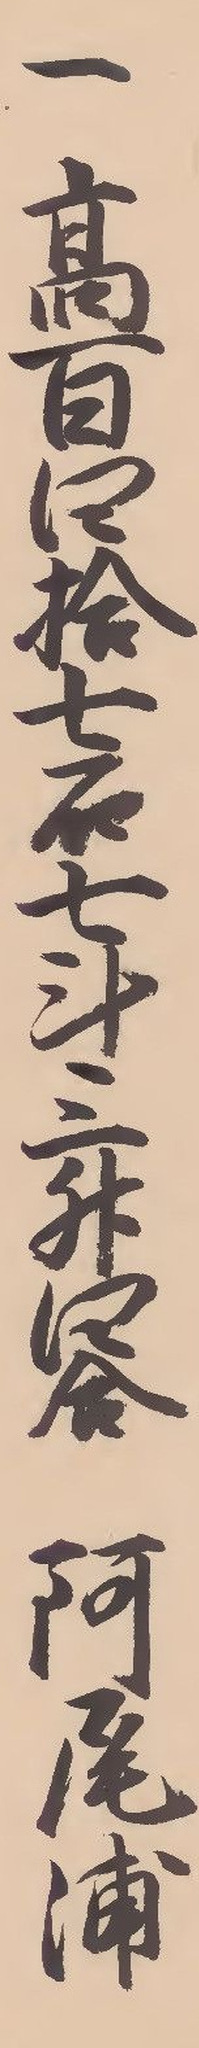一高百四拾七石七斗三升四合阿尾浦

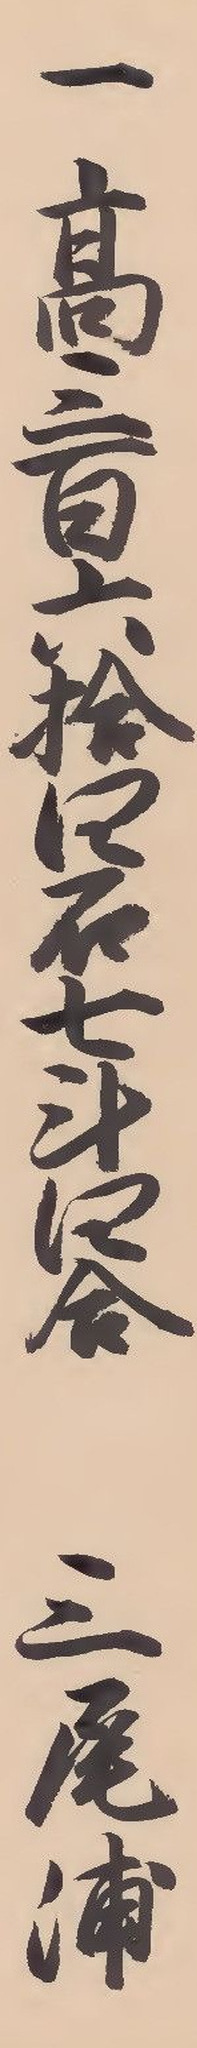一高三百六拾四石七斗四合三尾浦
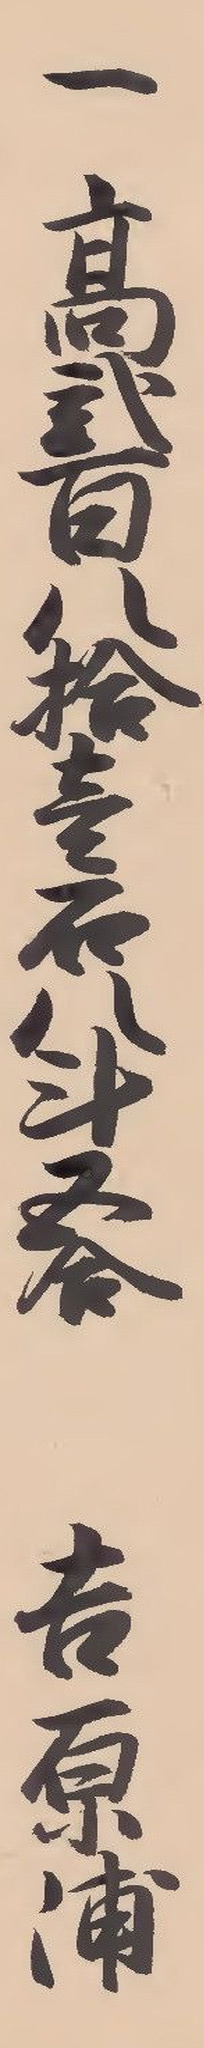一高弐百八拾壱石八斗五合吉原浦
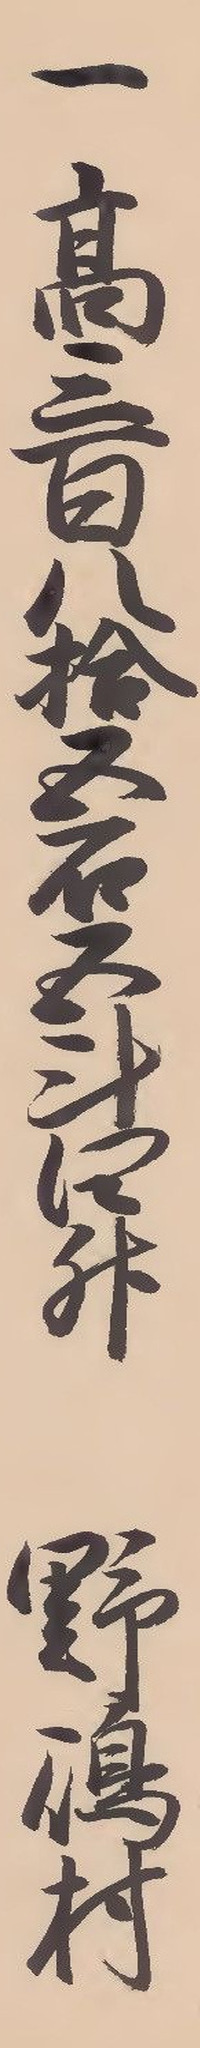一高三百八拾五石五斗四升野島村
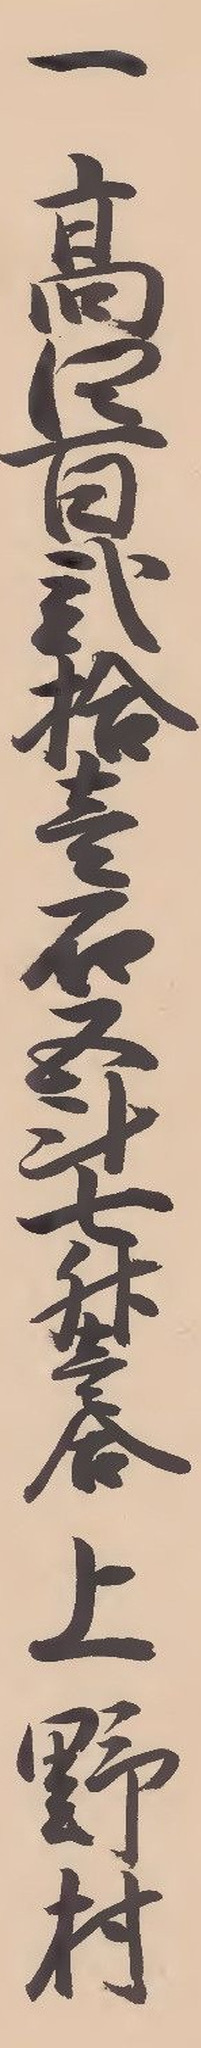一高四百弐拾壱石五斗七升壱合上野村
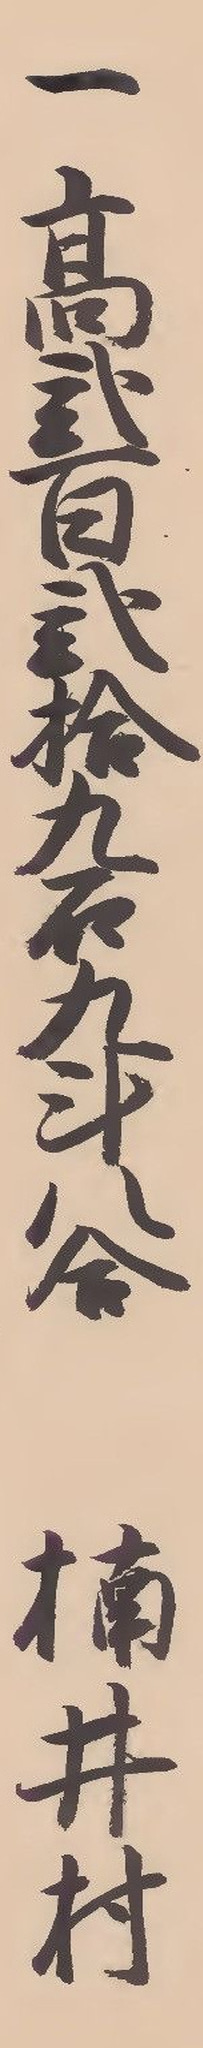一高弐百弐拾九石九斗八合楠井村

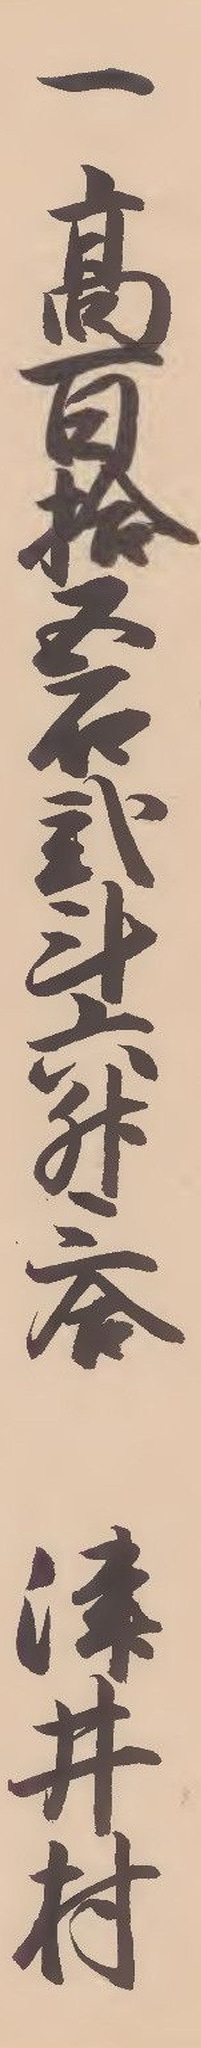一高百拾五石弐斗六升三合津井村
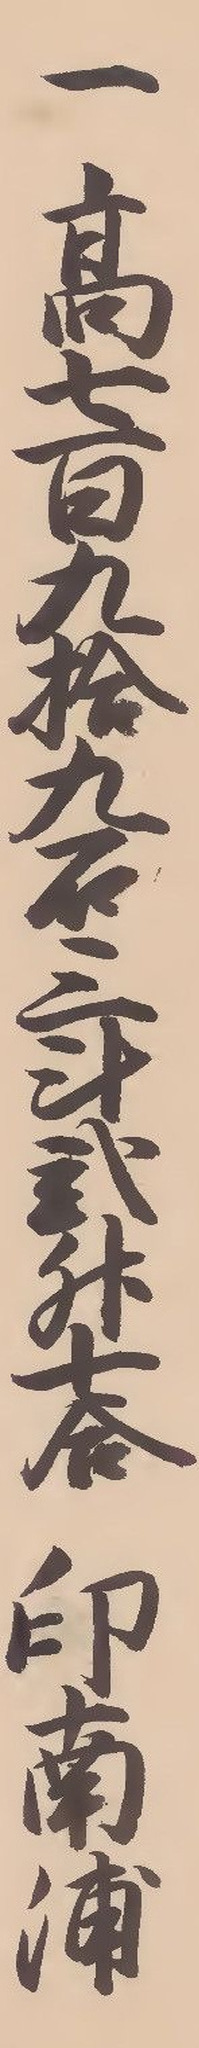一高七百九拾九石三斗弐升七合印南浦
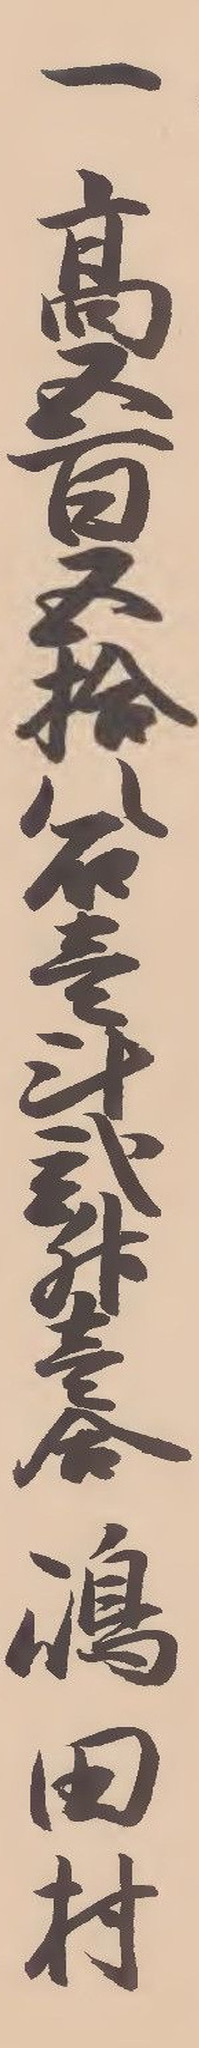一高五百五拾八石壱斗弐升壱合島田村
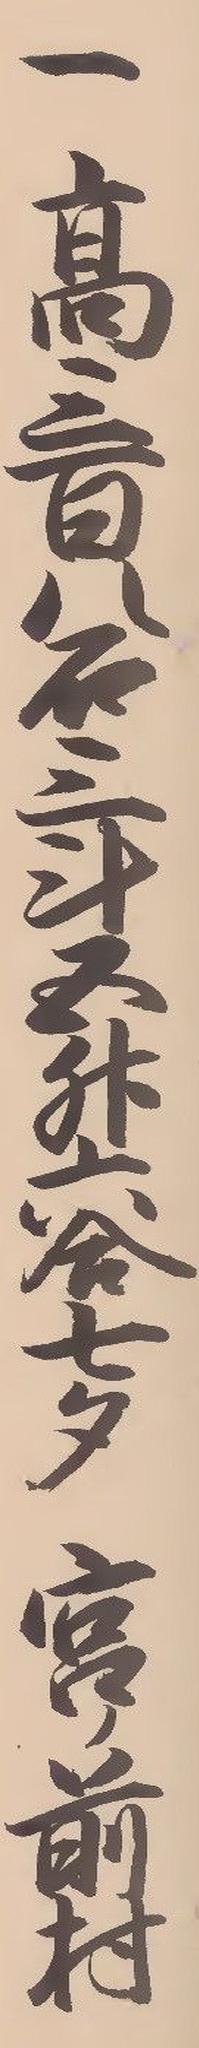一高三百八石三斗五升六合七勺宮ノ前村
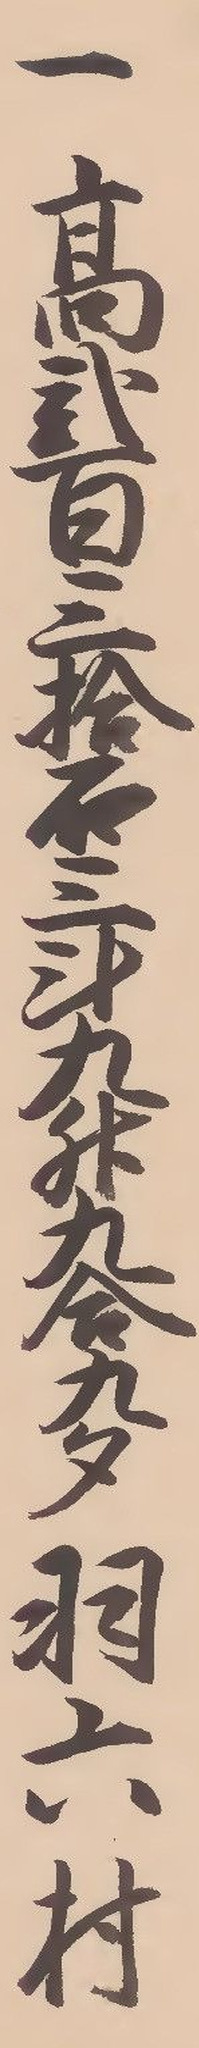一高弐百三拾石三斗九升九合九勺羽六村
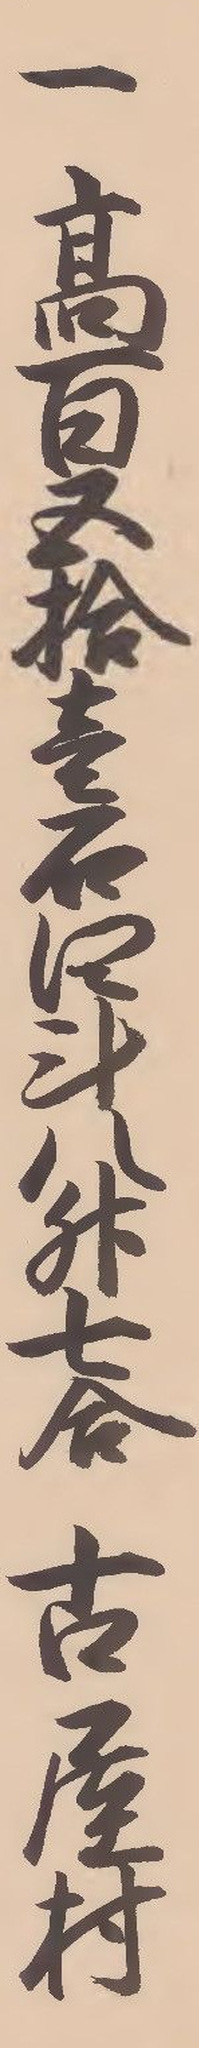一高百五拾壱石四斗八升七合古屋村
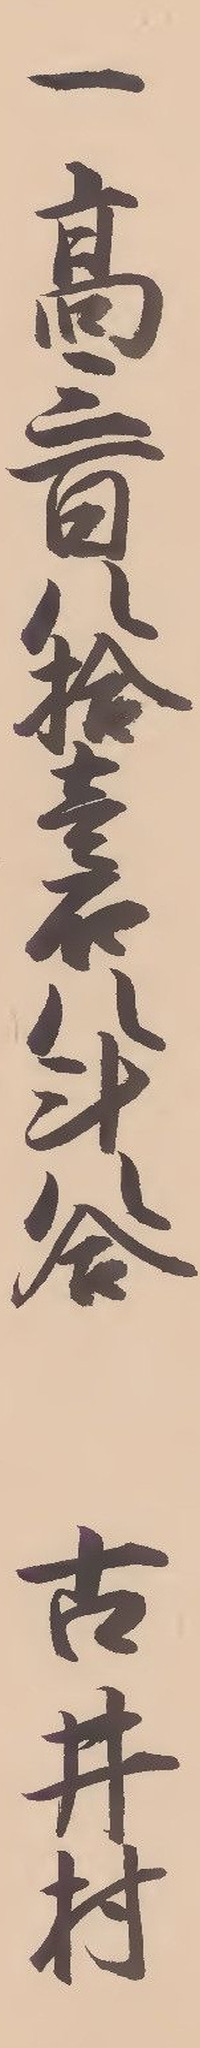一高三百八拾壱石八斗八合古井村

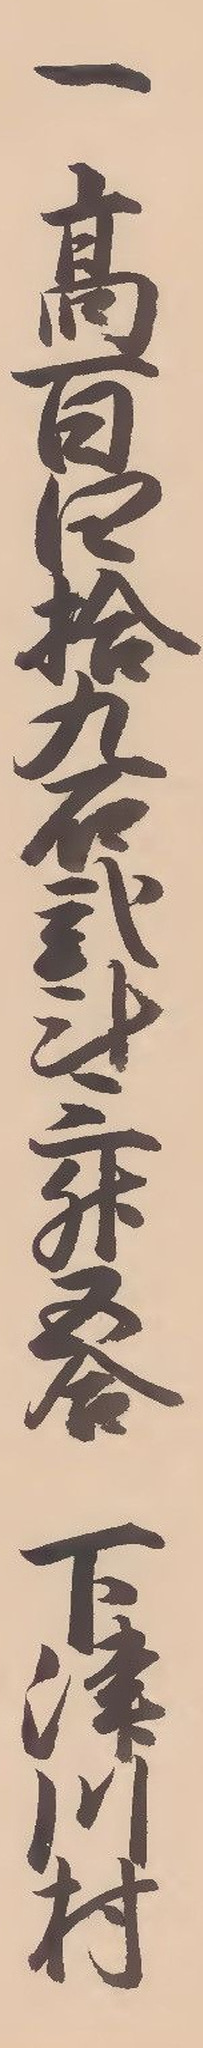一高百四拾九石弐斗三升五合下津川村
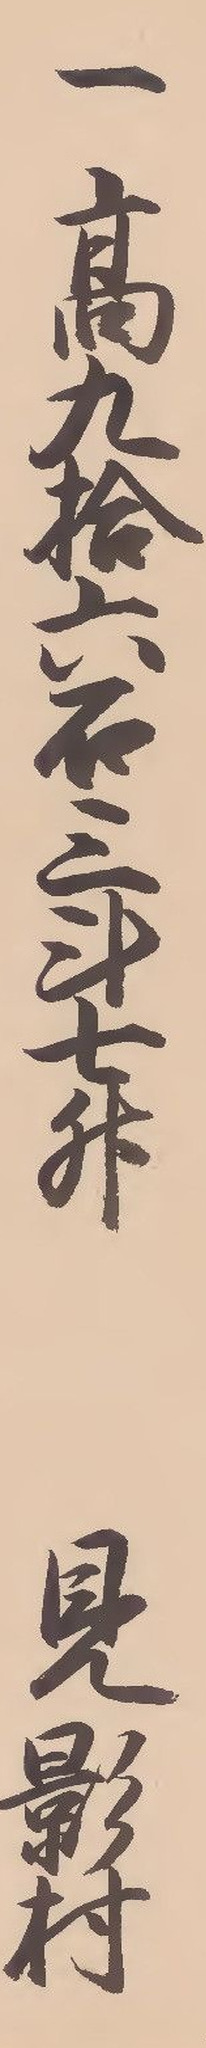一高九拾六石三斗七升見影村
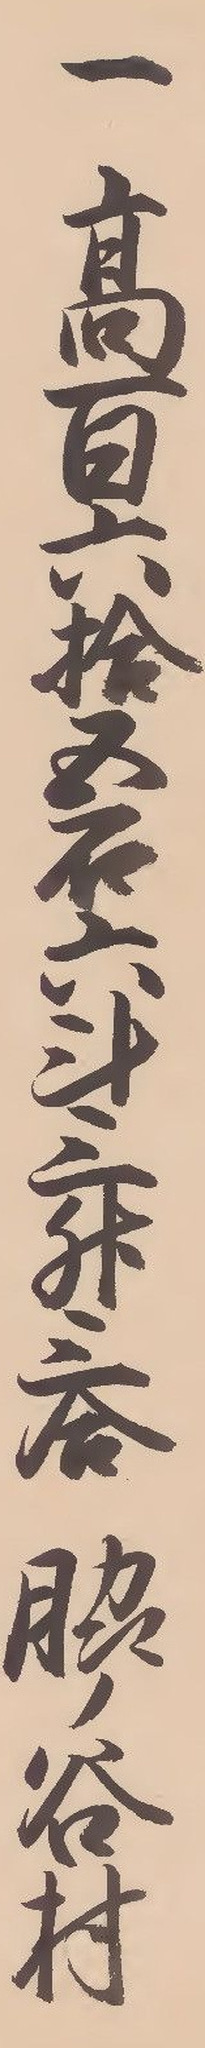一高百六拾五石六斗三升三合脇ノ谷村
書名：紀伊国郷帳
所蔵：国立公文書館 National Archives of Japan
